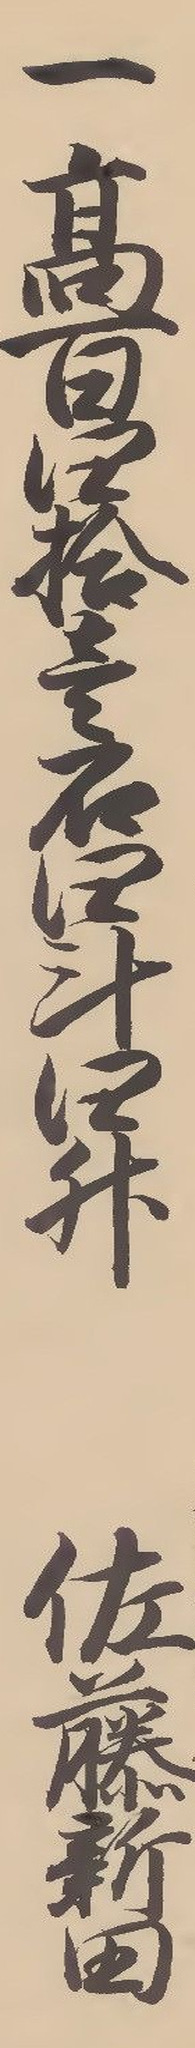一高百四拾壱石四斗四升佐藤新田
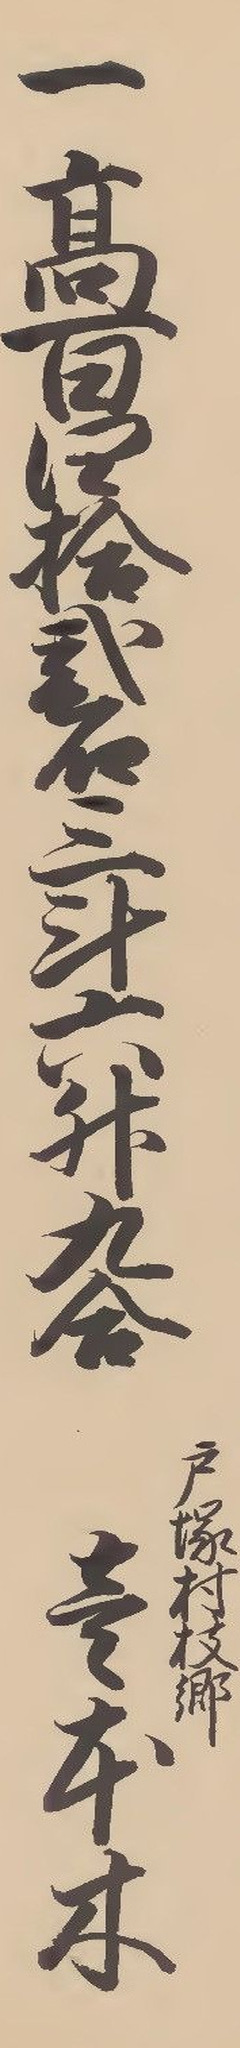一高百四拾弐石三斗六升九合壱本木
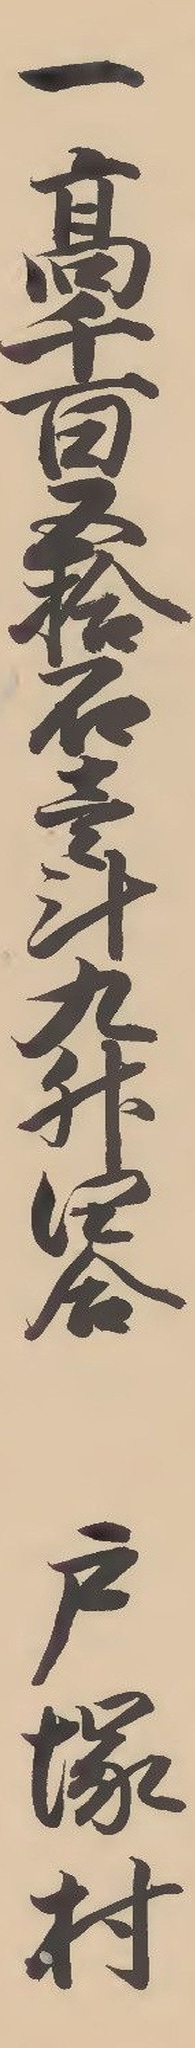一高千百五拾石壱斗九升四合戸塚村
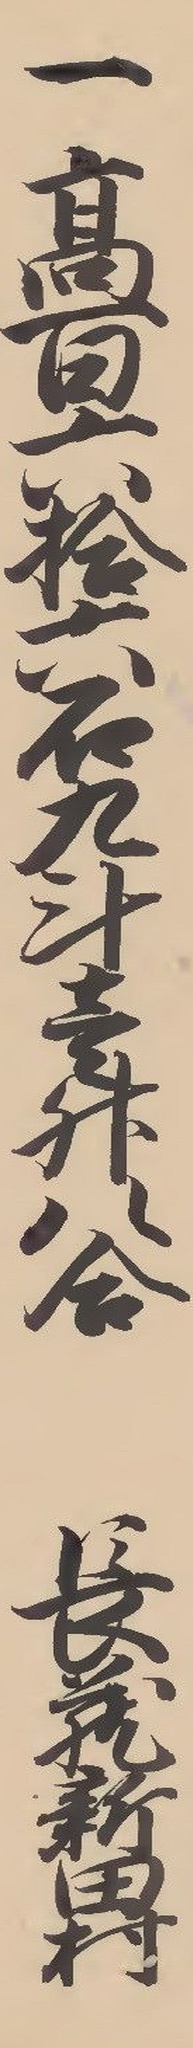一高百六拾六石九斗壱升八合長蔵新田村
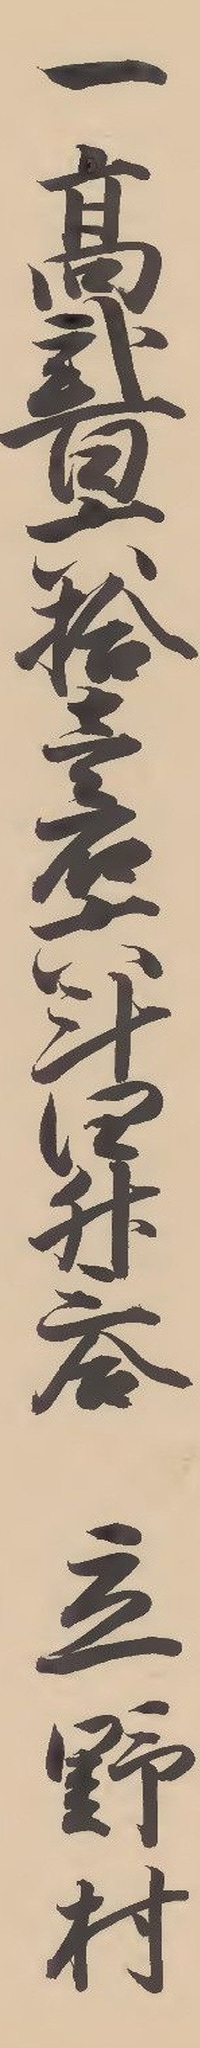一高弐百六拾壱石六斗四升三合立野村
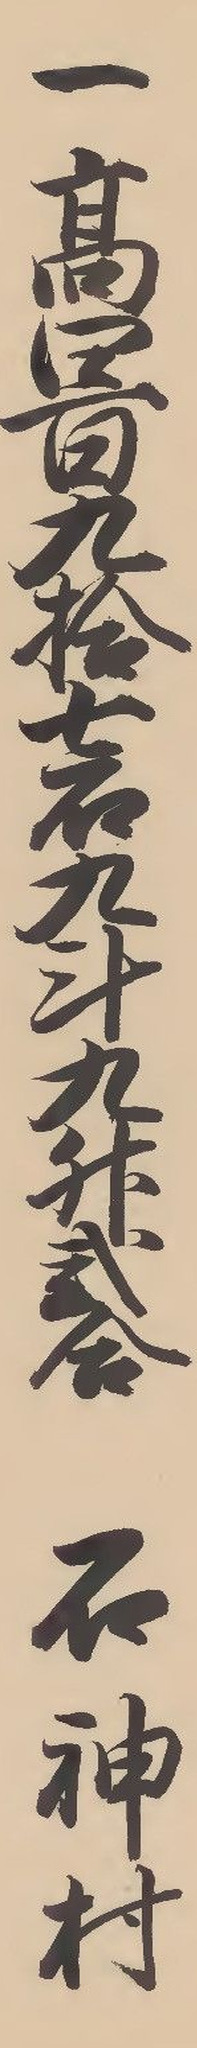一高四百九拾七石九斗九升弐合石神村
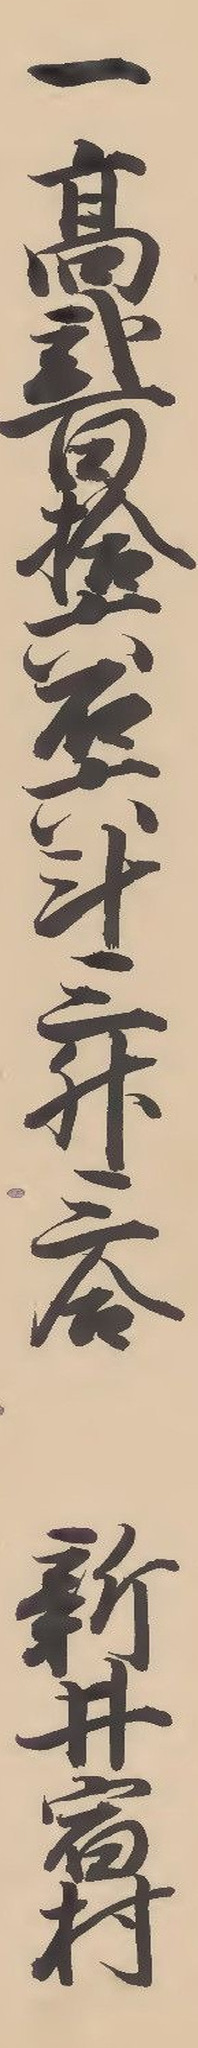一高弐百拾六石六斗三升三合新井宿村

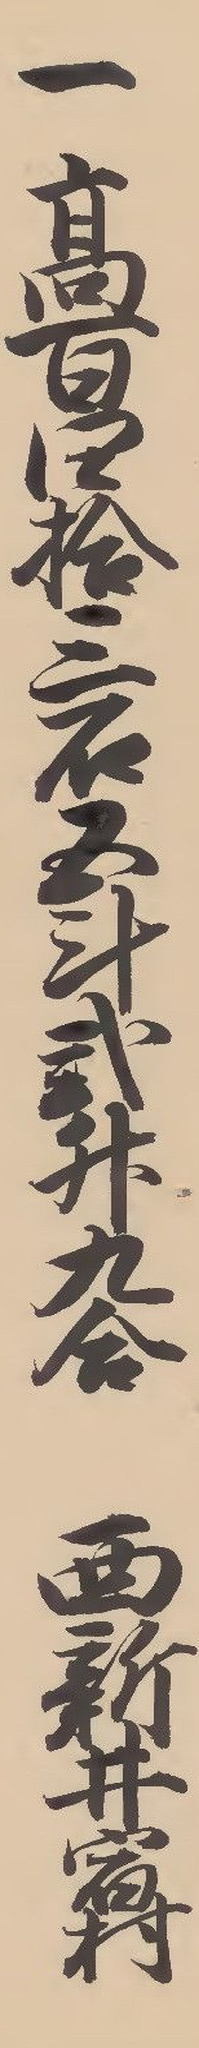一高百四拾三石五斗弐升九合西新井宿村
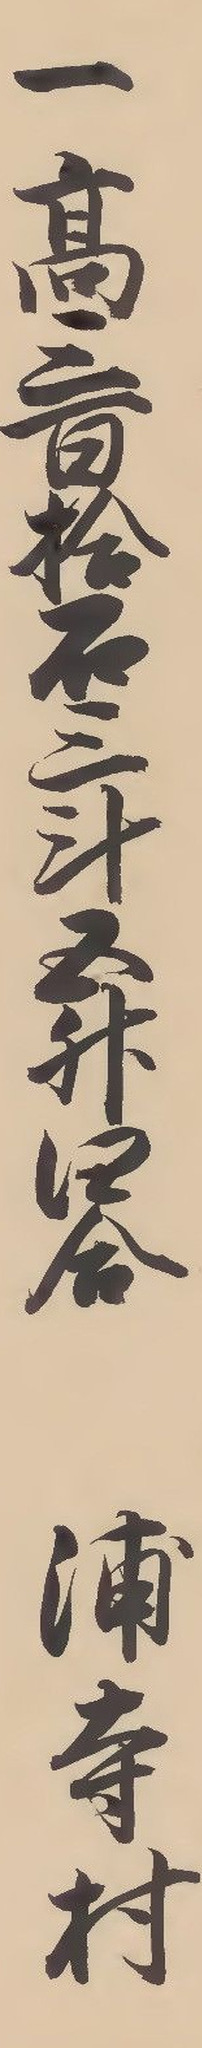一高三百拾石三斗五升四合浦寺村
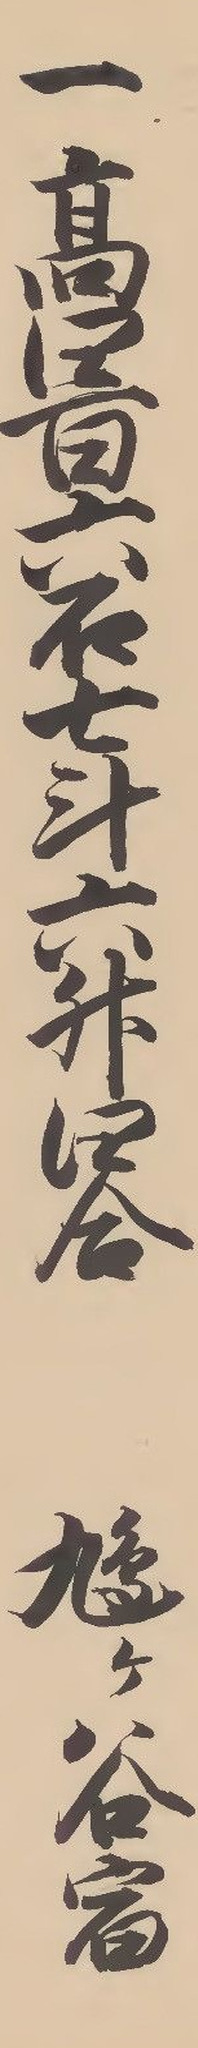一高四百六石七斗六升四合鳩ヶ谷宿
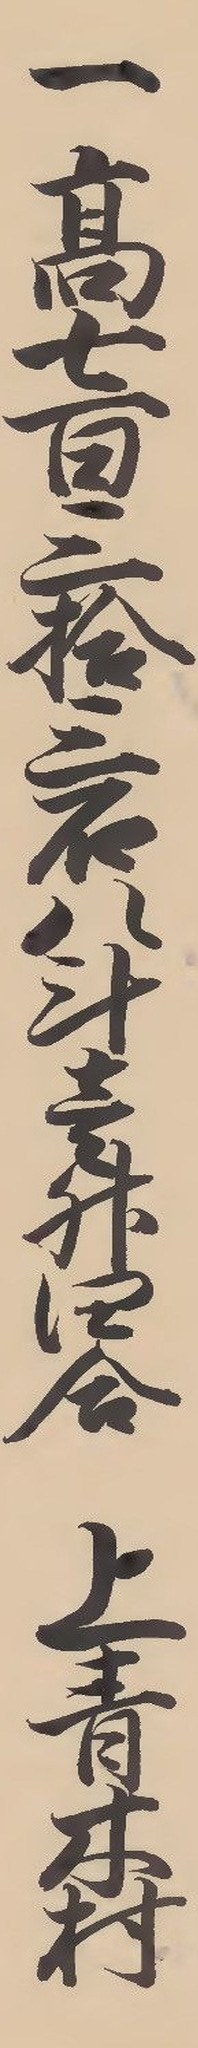一高七百三拾三石八斗壱升四合上青木村
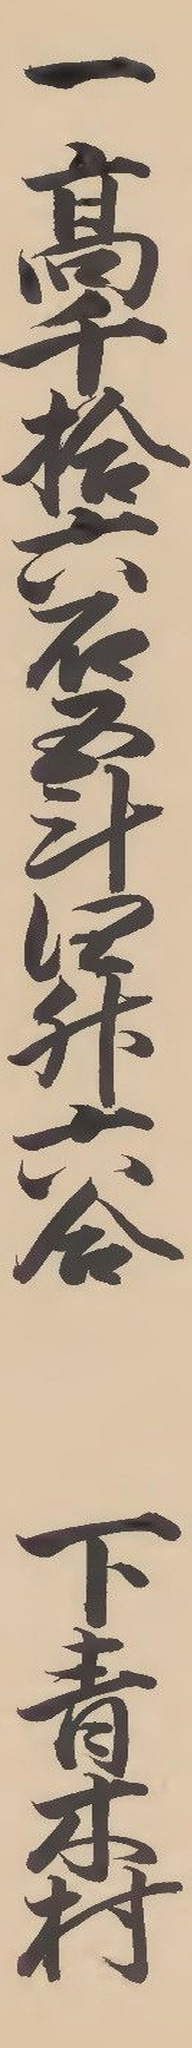一高千拾六石五斗四升六合下青木村
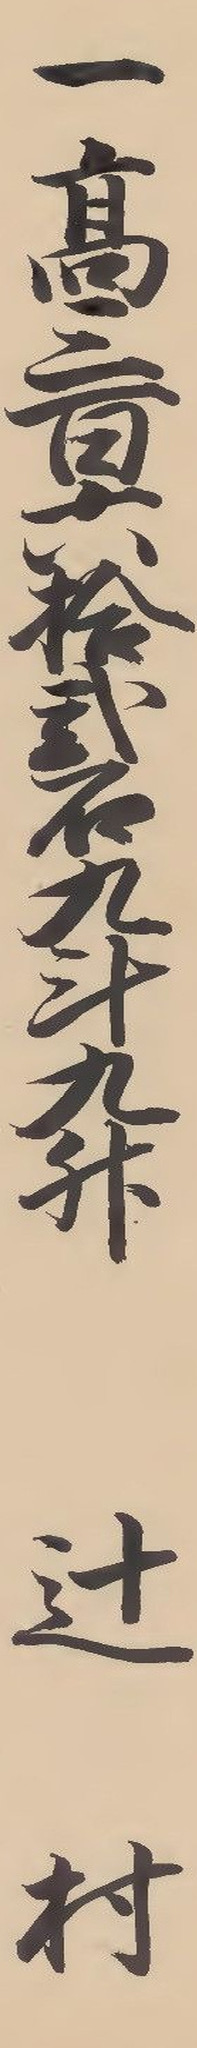一高三百六拾弐石九斗九升辻村
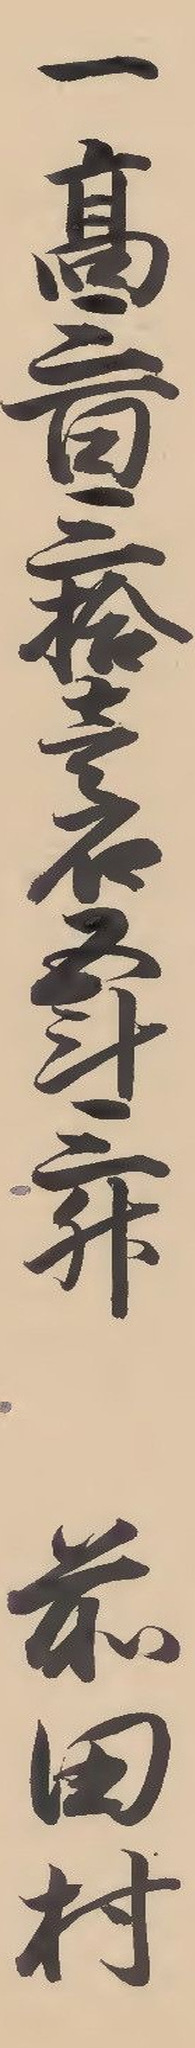一高三百三拾壱石五斗三升前田村

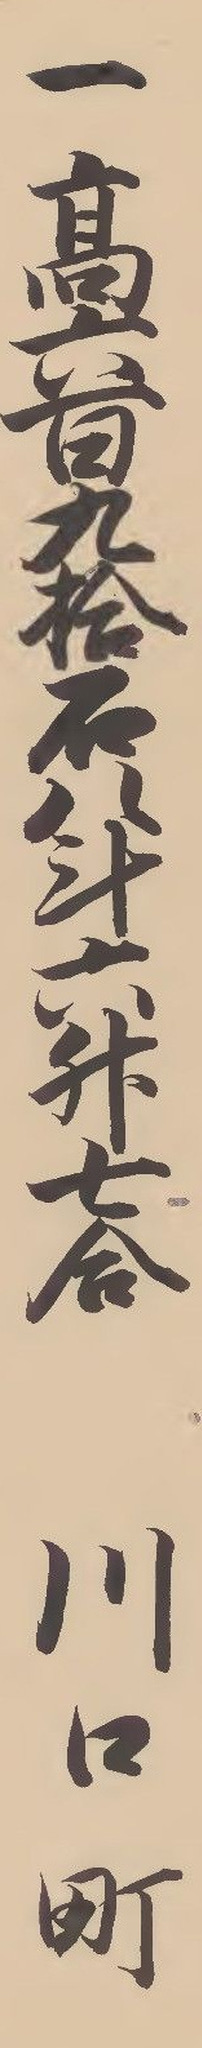一高六百九拾石八斗六升七合川口町
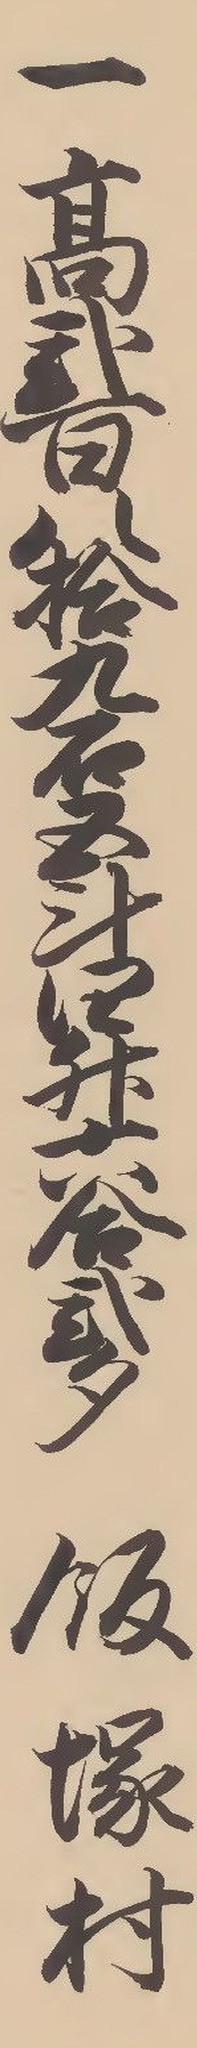一高弐百八拾九石五斗四升六合弐勺飯塚村
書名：武蔵国郷帳　下
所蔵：国立公文書館 National Archives of Japan
